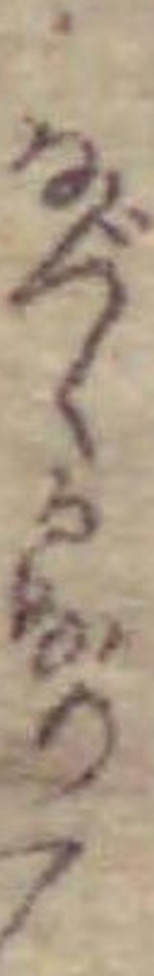なづくるなり
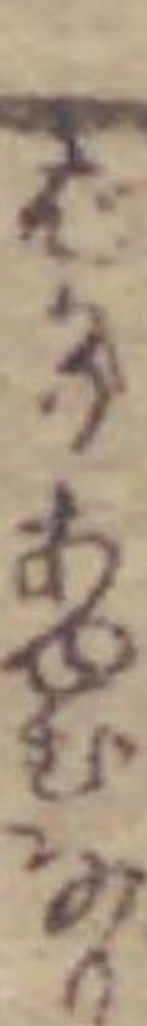ばかりあゆむなり
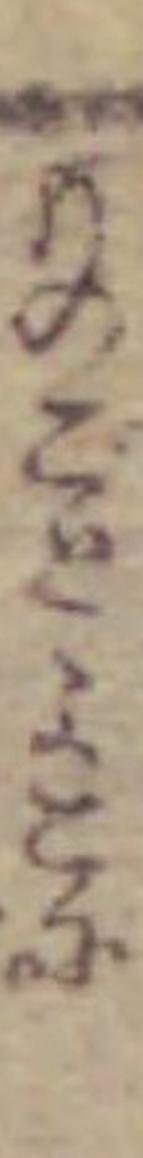ものごとよこに
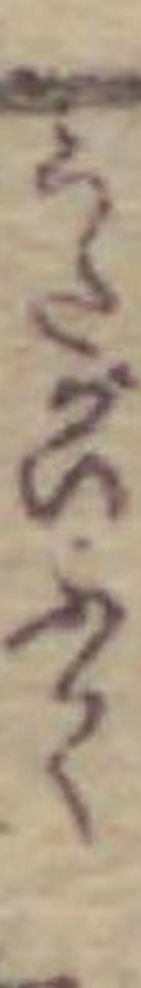うたがいふかく
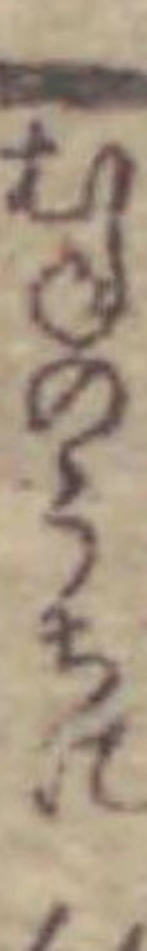むねのうちに
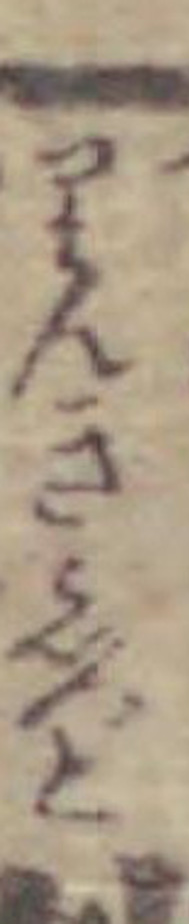りんきしつと
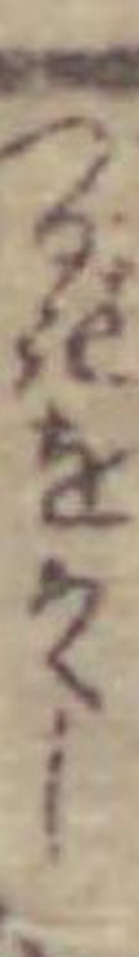つるぎをかくし
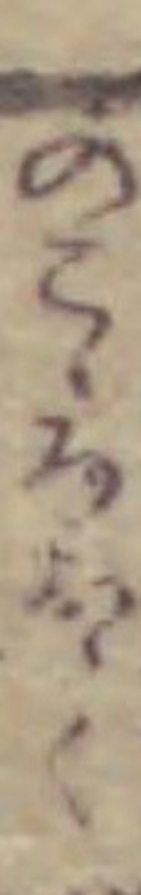のこゝろおゝく
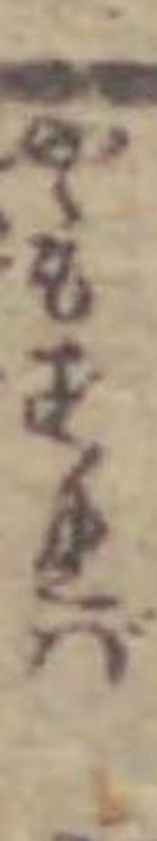ややもすれば
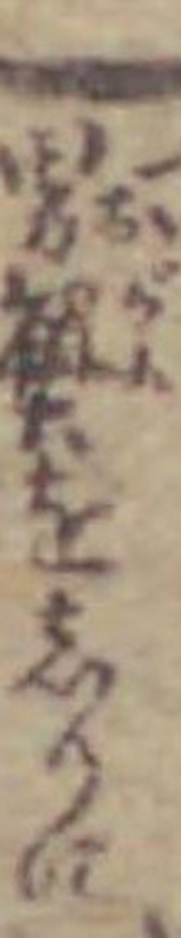男蟹をしりに
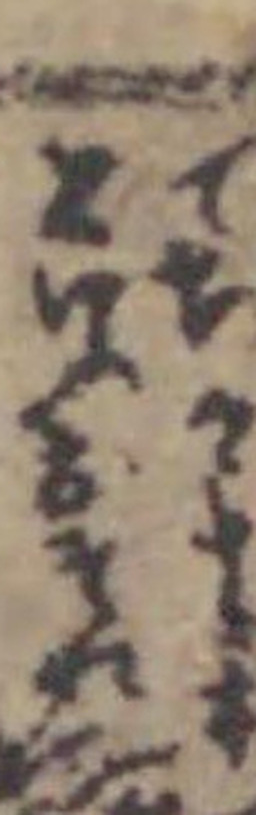といふおそれ
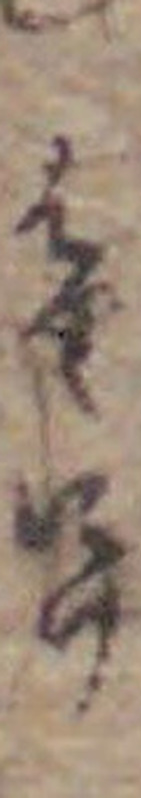はやくにけ
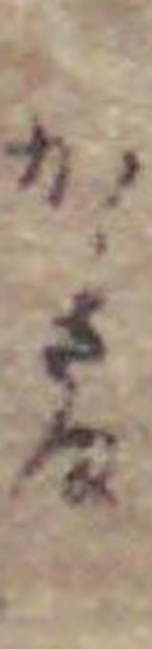かかさま
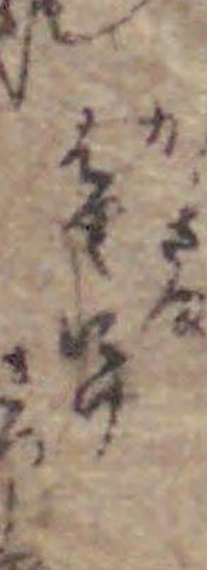はやくにけ
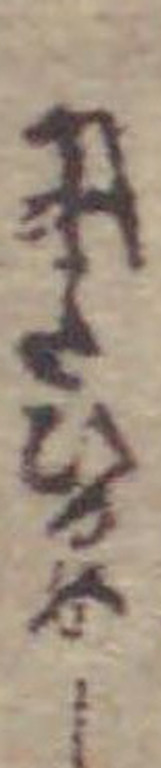〽またひるめし
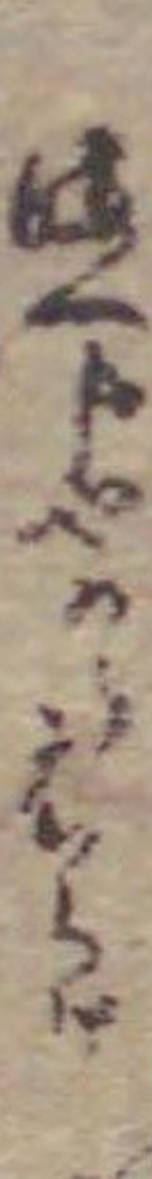まへじやからはらが
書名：化物和本草 : 3巻
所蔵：国立国会図書館 National Diet Library, JAPAN
